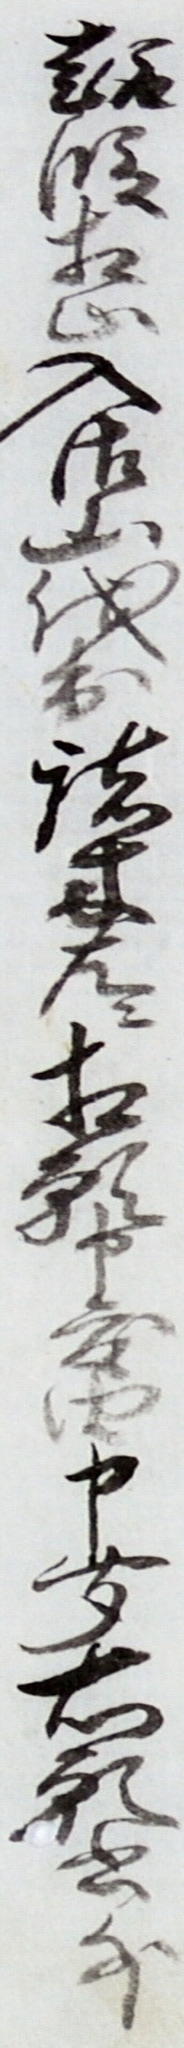越段相正入御山伐出諸木共ニ相願申度由申聞右願書外
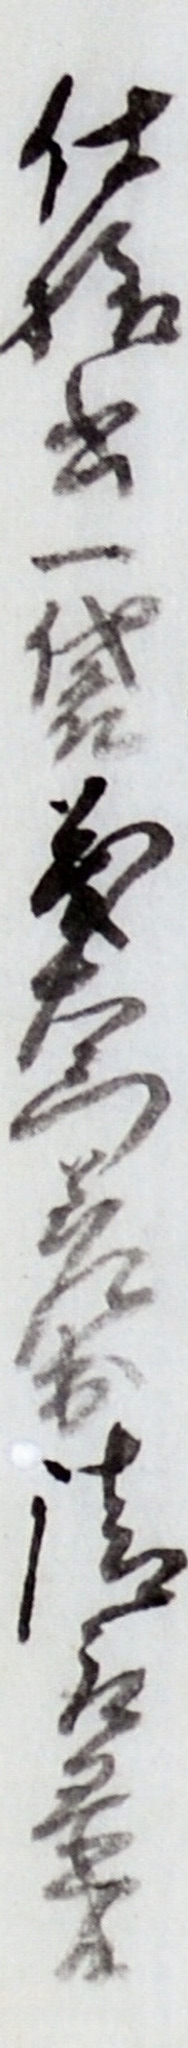仕様書一袋義右衛門差出請取置候

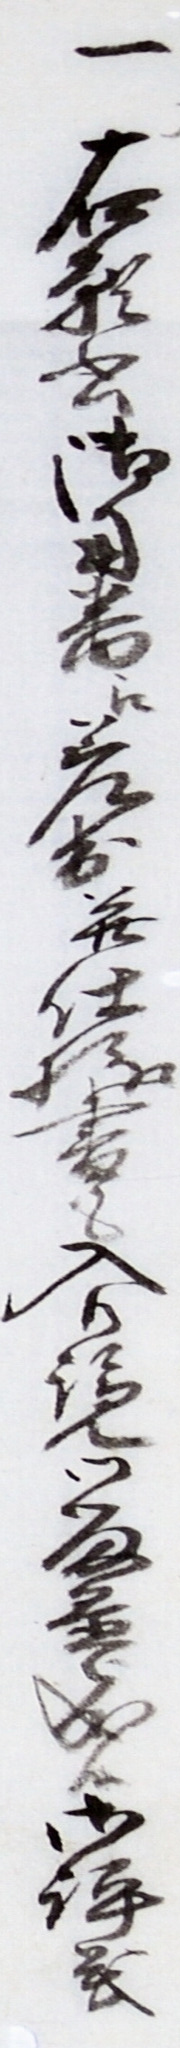一右願書御用番江差出并仕様書も入御覧御留置被成候御評義
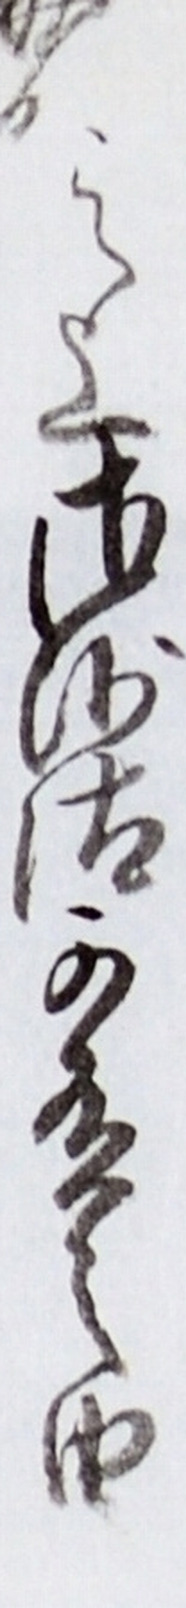之上御沙汰可有之由
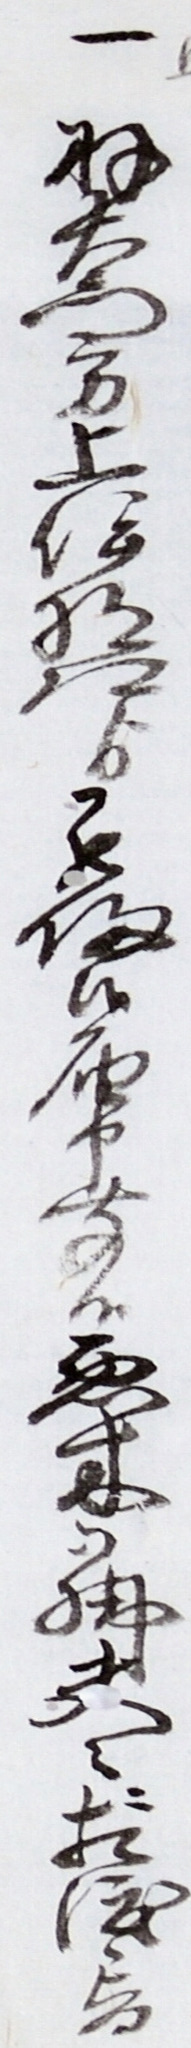一羽右衛門方上伊那郷より罷帰候届申聞候惣木御払相渡候旨
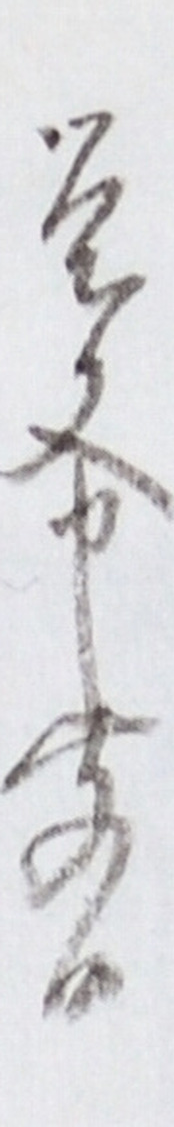是又申聞候
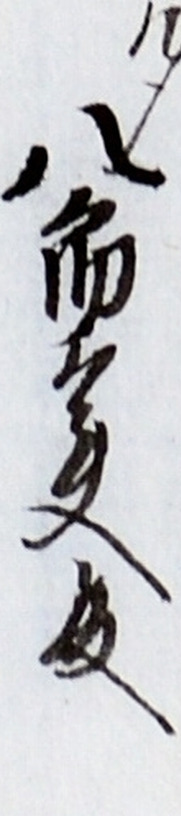八郎太夫殿
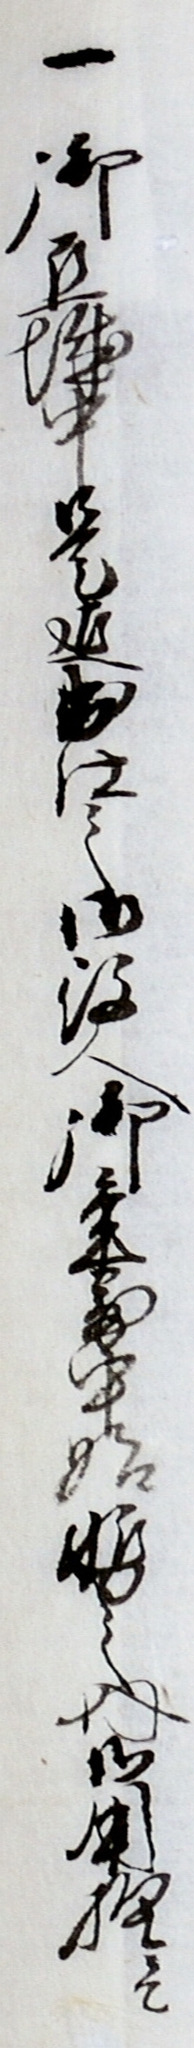一御在城中是迄出仕之御役人御来番中始暫之内御用捨にて
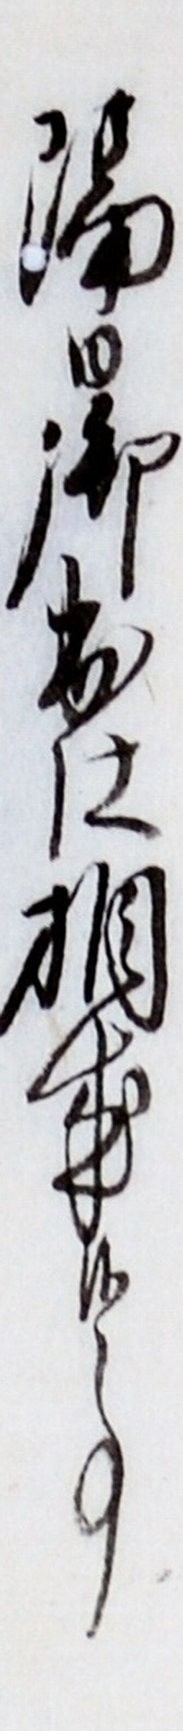隔日御出仕相成候事
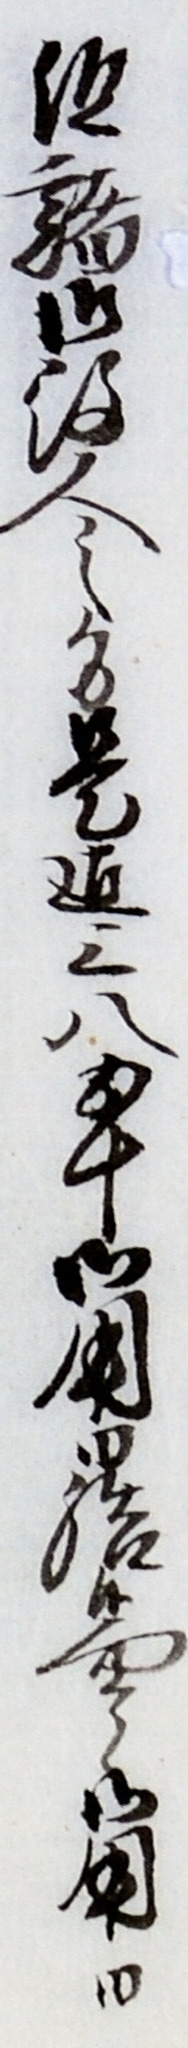組諸御役人之方是迄三八五斗御用御給候面々御用口
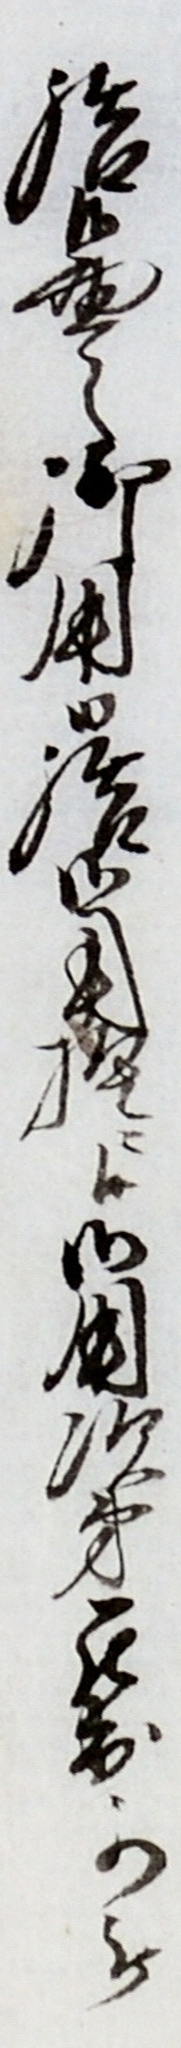給候無之御用御繕御用捨に候御用次第罷出可被
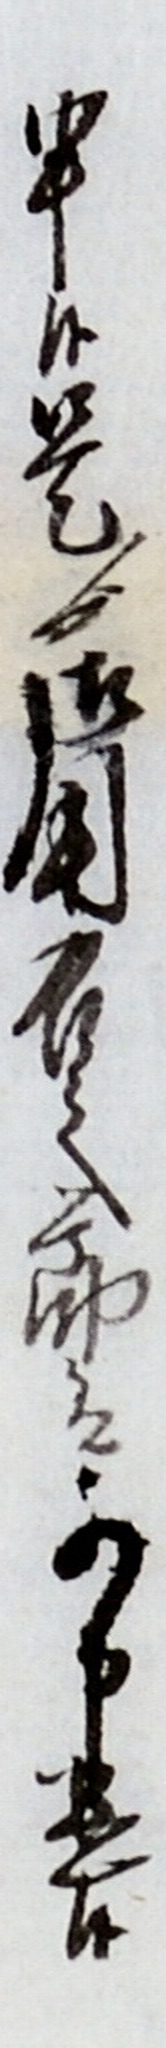申候是より御用召之節は可申遣候
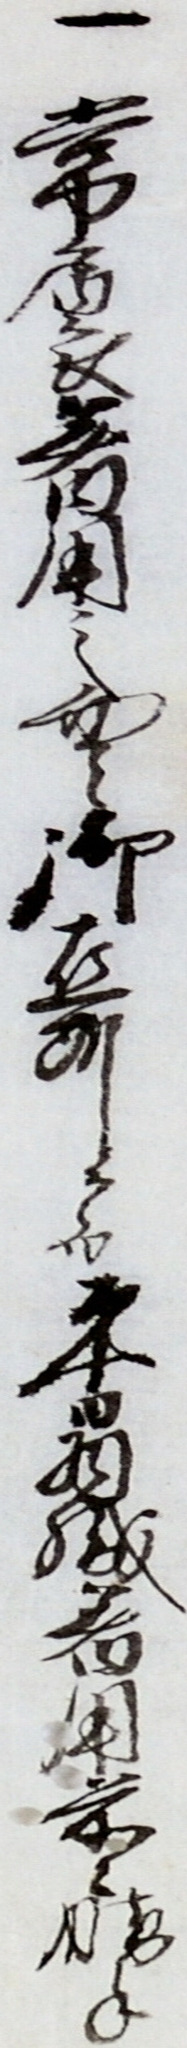一常着用之面々御在所ニも平日羽織着用前之勝手
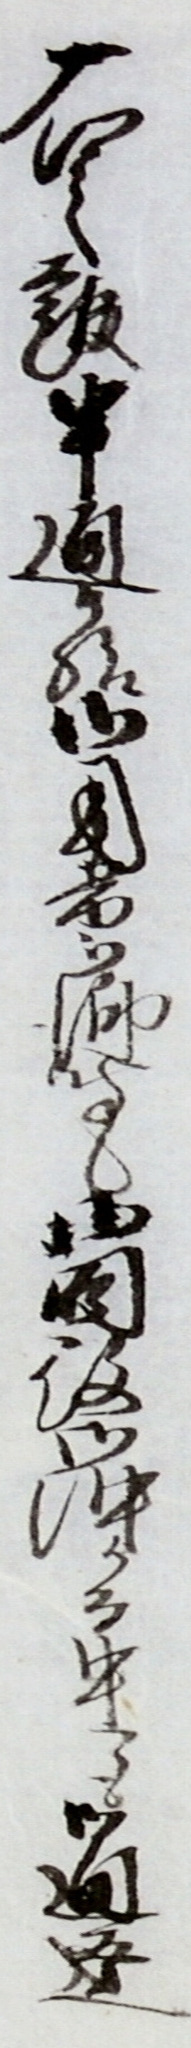右之趣申通候様御用番仰聞候も御国役御沖ニ而中ニも御通達
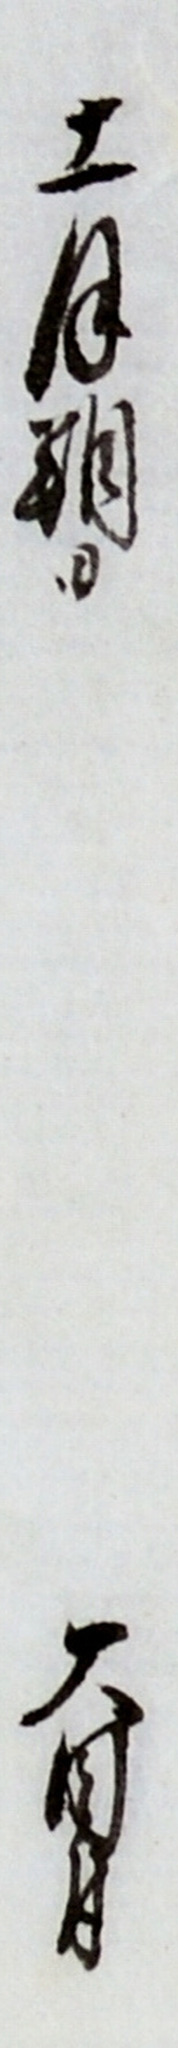十一月朔日大目付
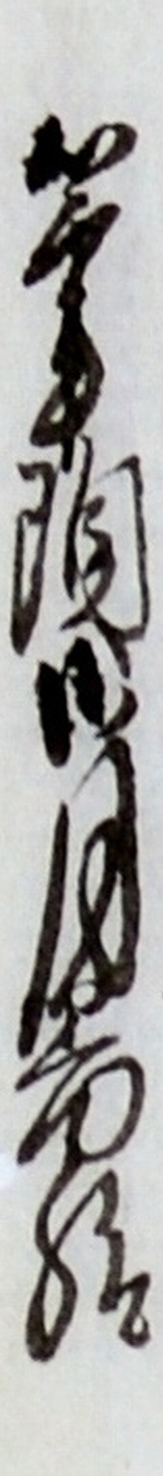筆附御月番給
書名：御山奉行御用控
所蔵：伊那市立高遠町図書館・合同会社AMANE
